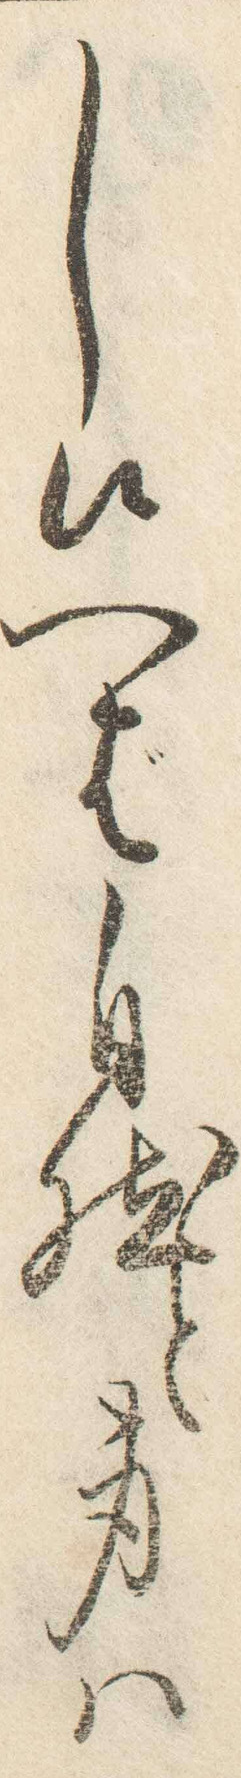し候へば自然と身は
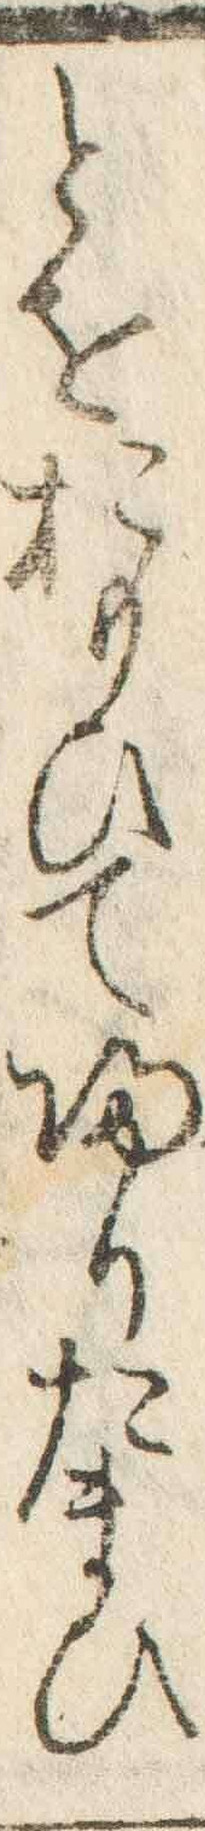とをおもひて帰りたまひ
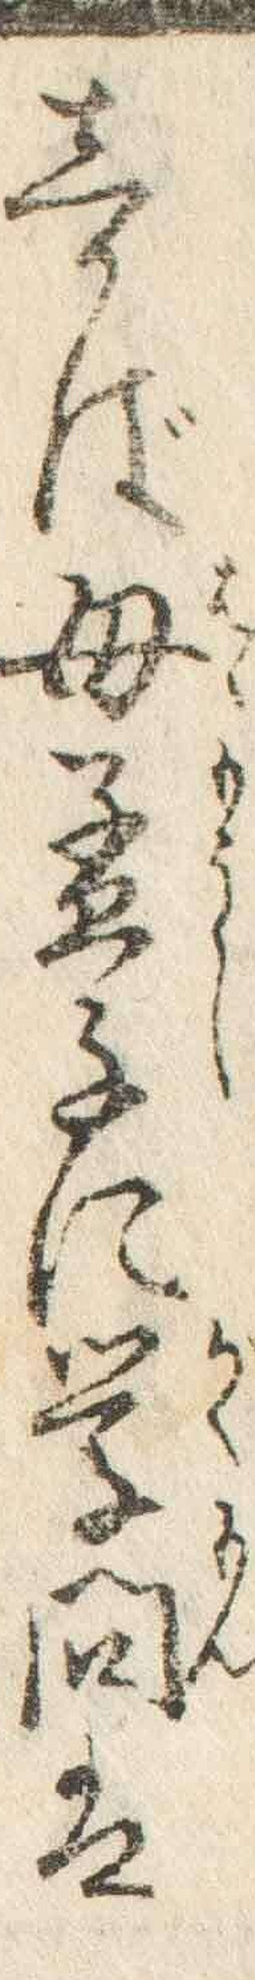しかば母孟子に学問は
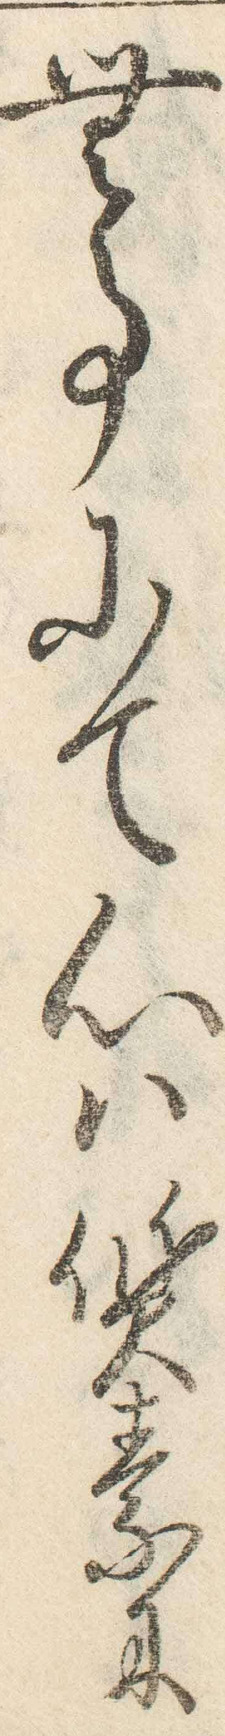無事にて心は質素に
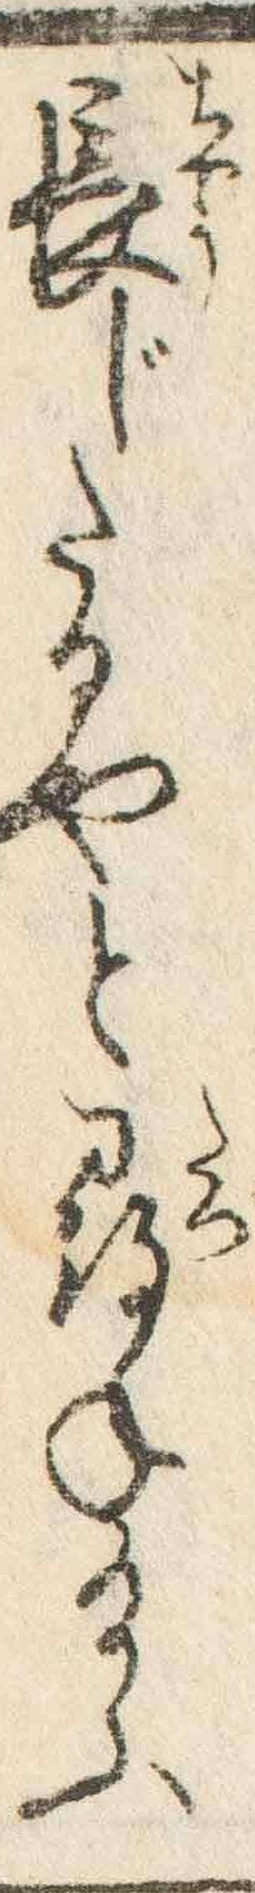長じたるやと尋ね給ふ
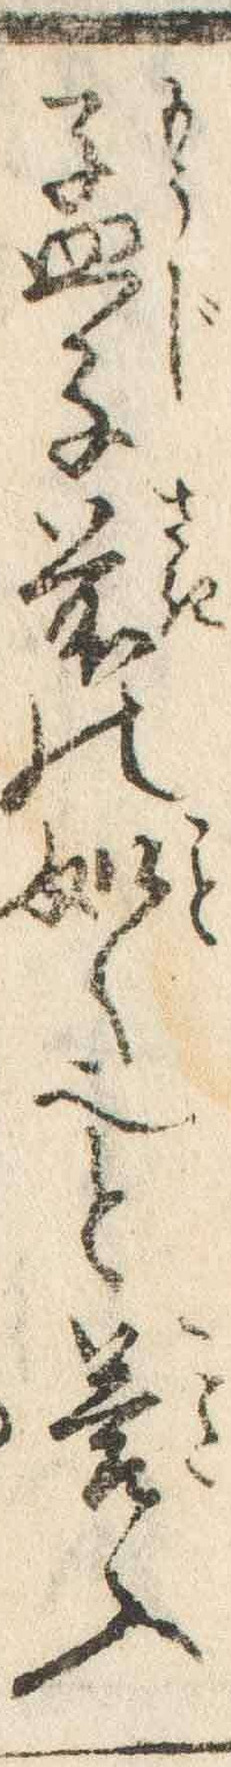孟子前の如く也と答ふ
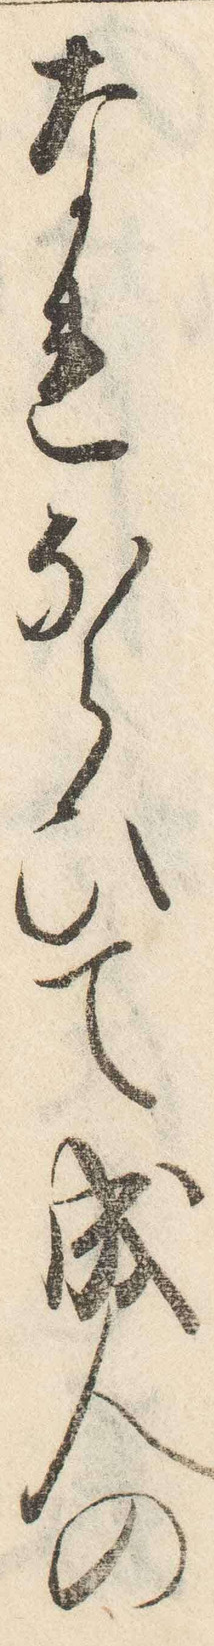なれならひて成人の
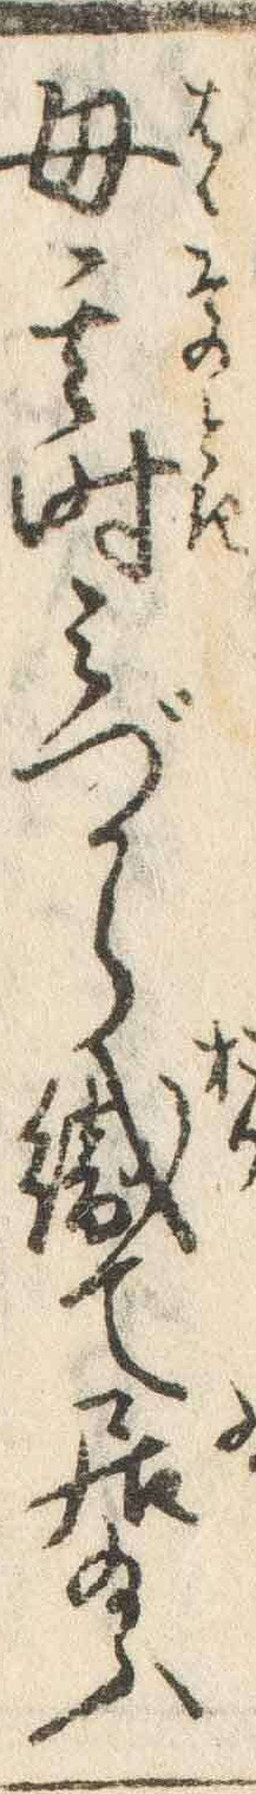母其時みづから織て居給ふ
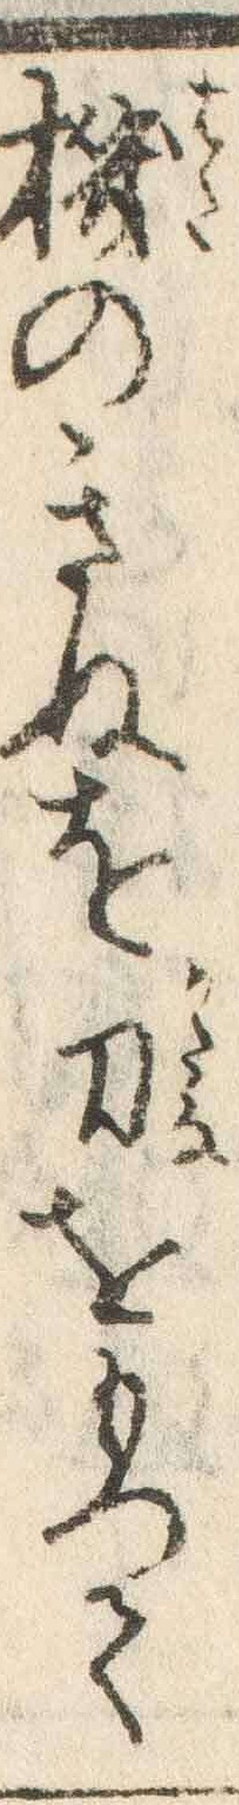機のきぬを刀をもつて
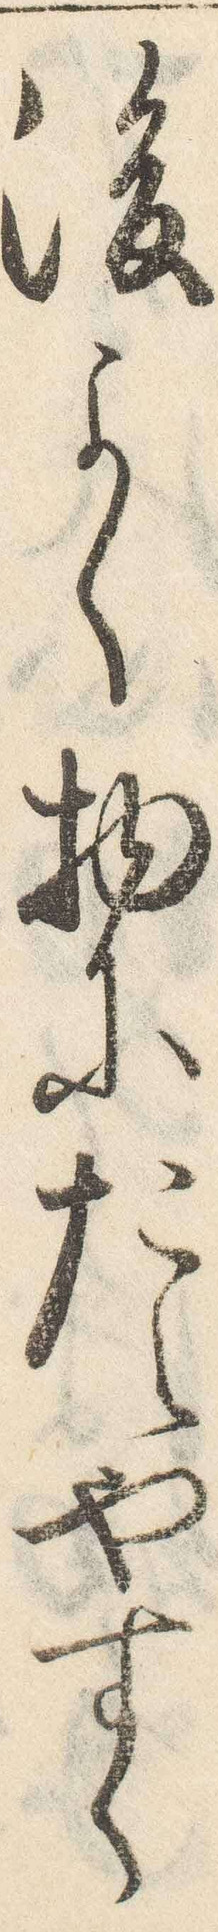後よく物にたえやすく
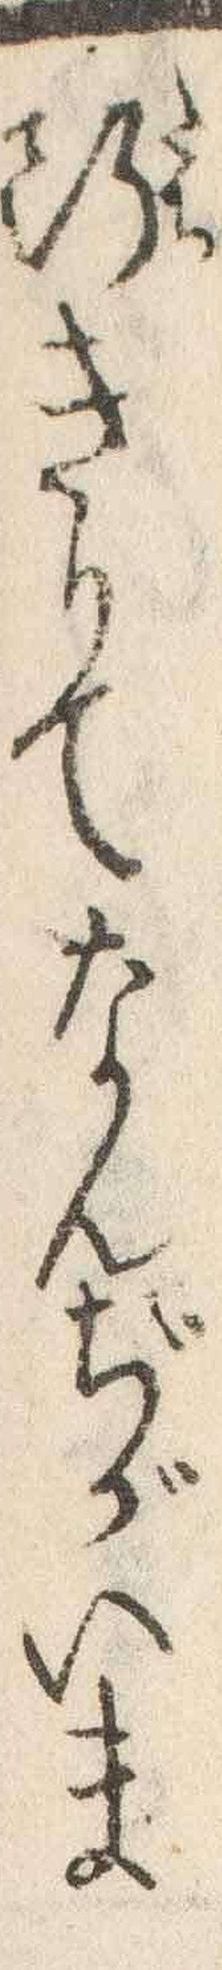断きりてなんぢがいま
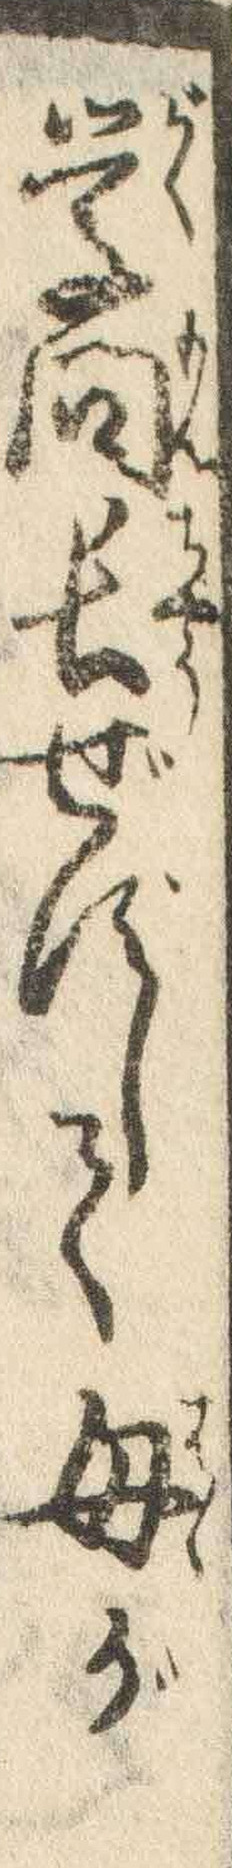学問長ぜずして母が
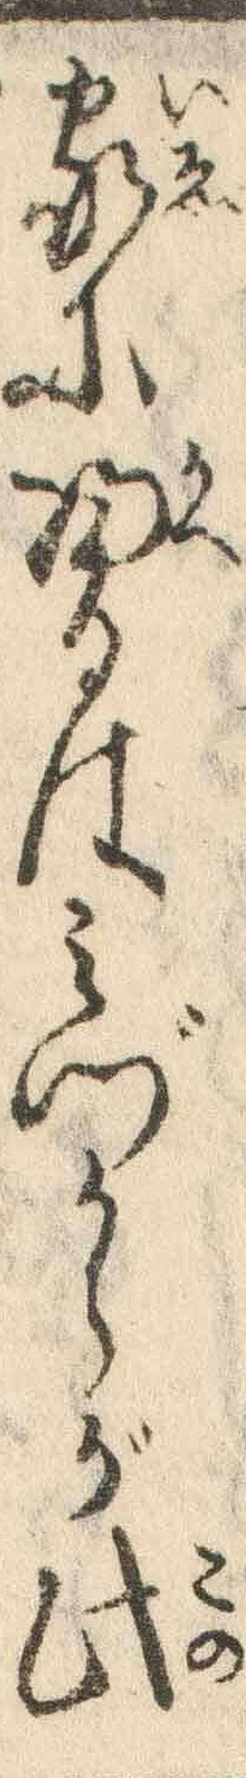家に帰るはみづからが此
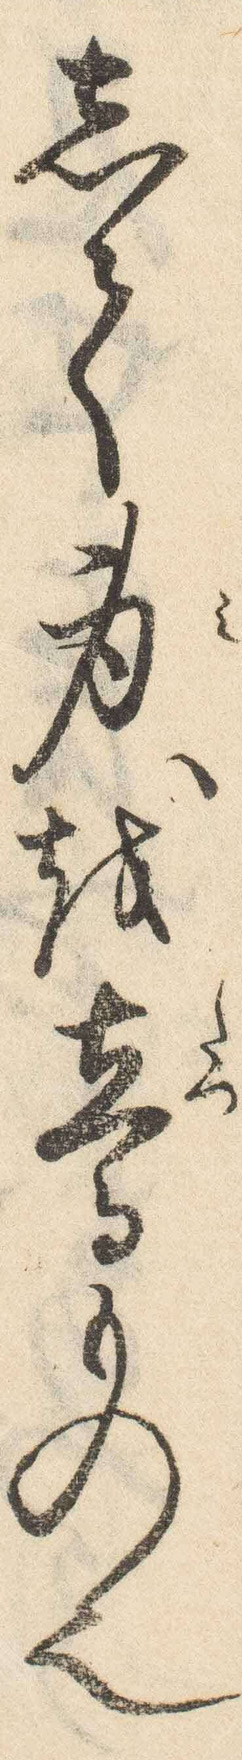して身を立るもの也
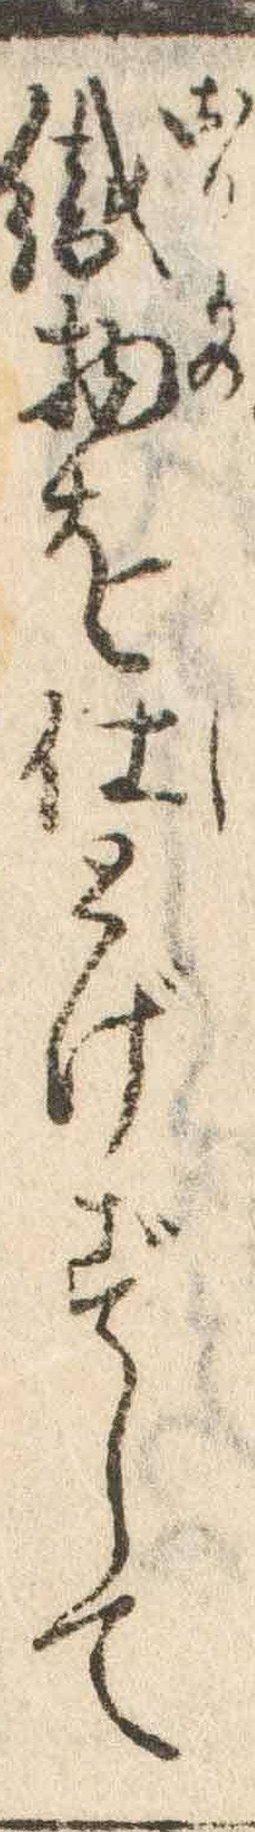織物を仕とげずして
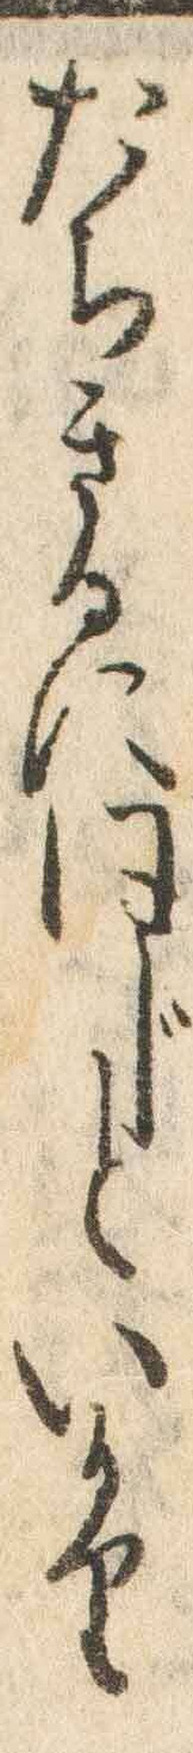たちきるに同じといかり
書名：撫育草
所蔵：東京学芸大学附属図書館 国文学研究資料館
